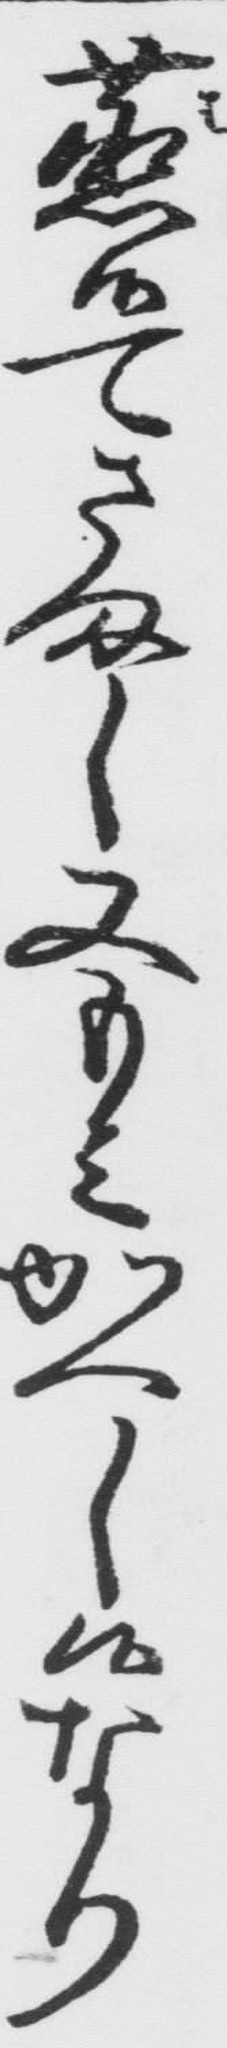蒸候てさまし又もみかへし候なり
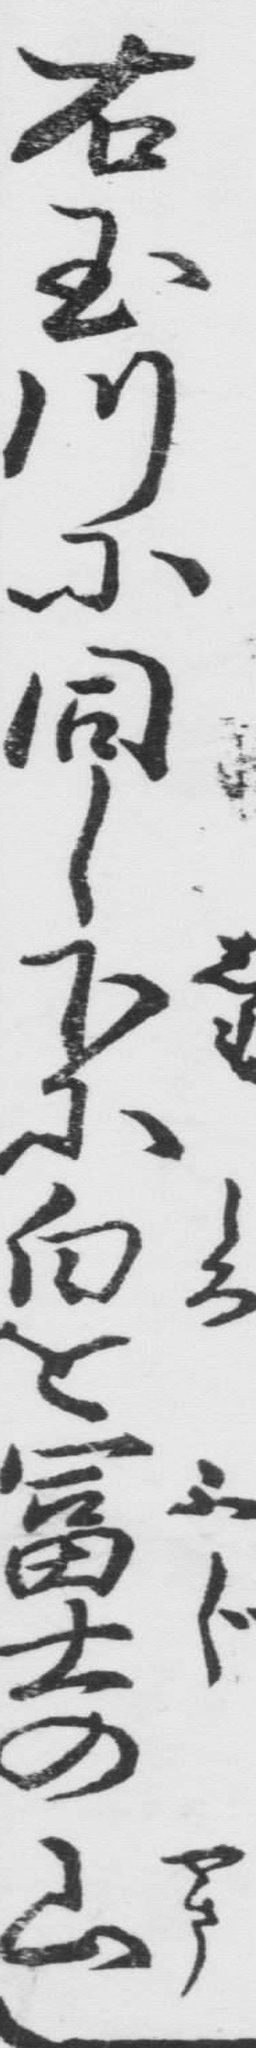右玉川に同し下に白を富士の山
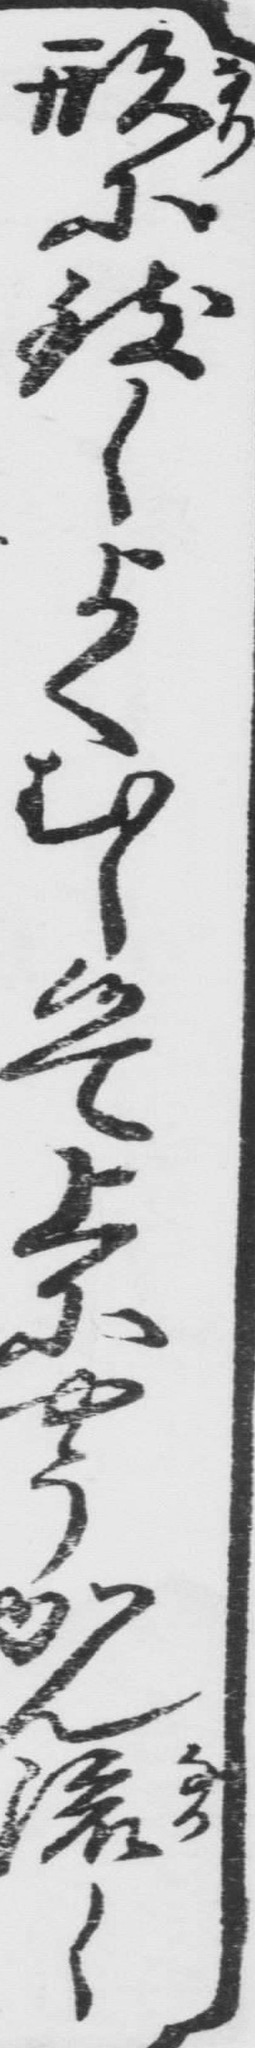形に致しよくむし候て上にやうかん流し
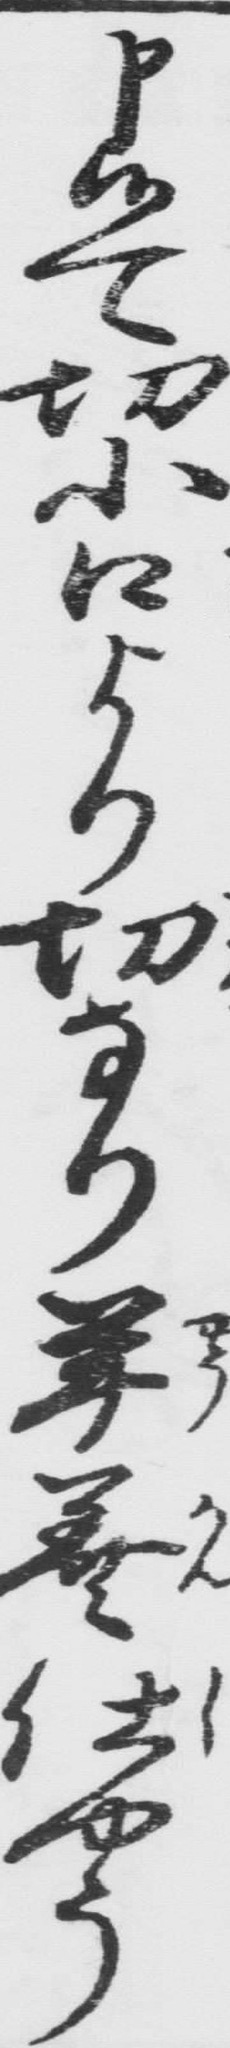申候て切小口より切なり羊羹仕やう
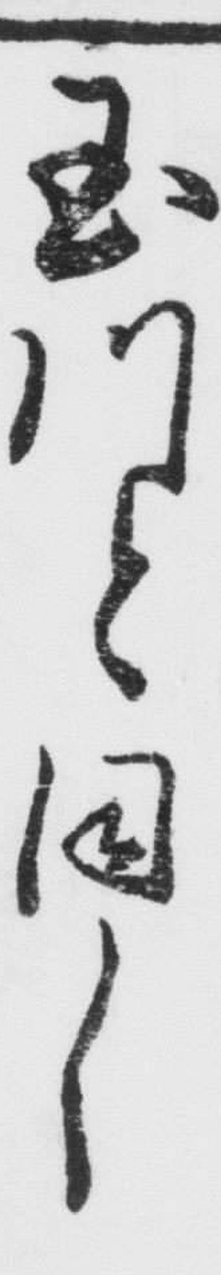玉川と同し
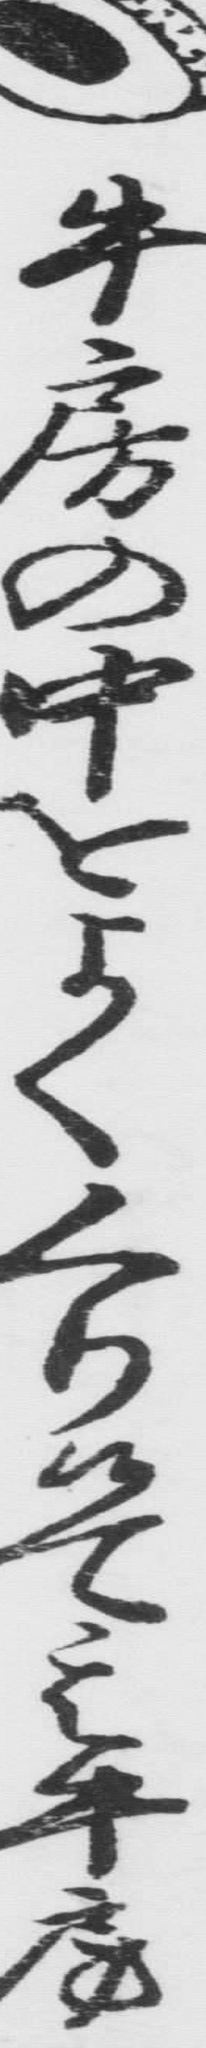牛蒡の中をよくくり候て其牛蒡
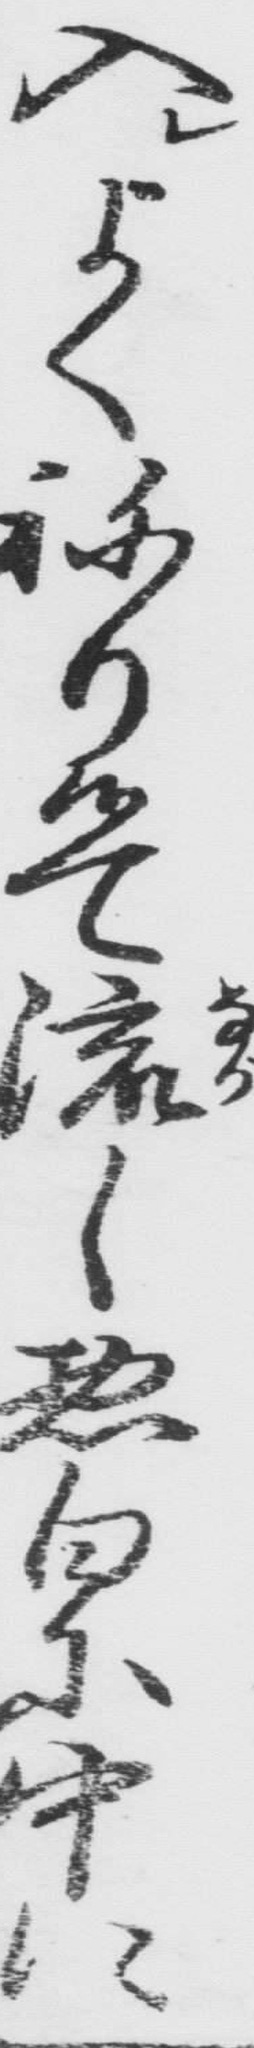入れよくねり候て流し惣白に中に

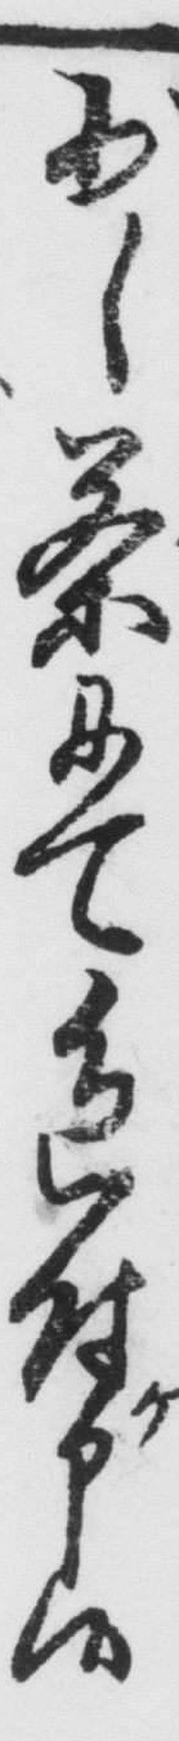少し茶にて色付け申候
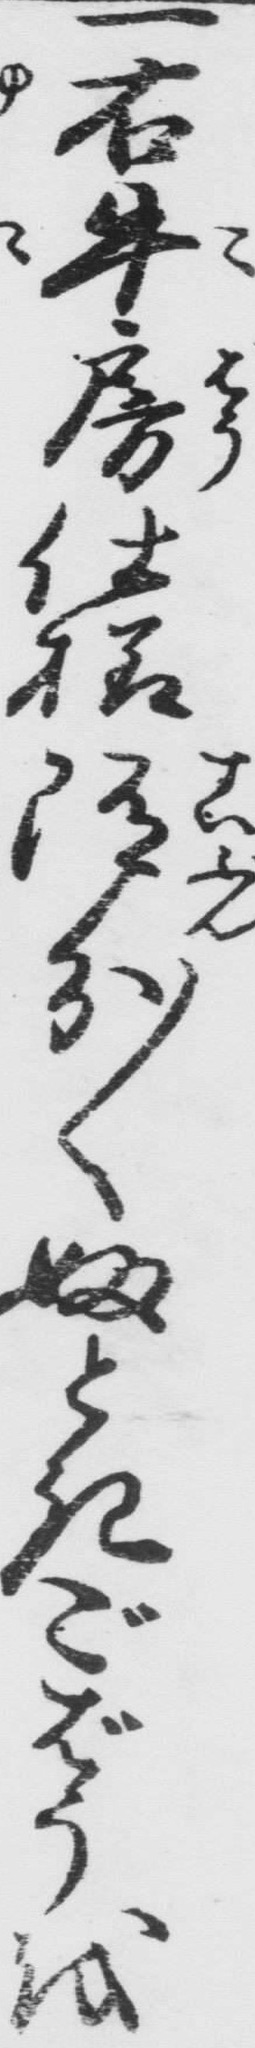一右牛蒡仕様随分〳〵ふときごばうを
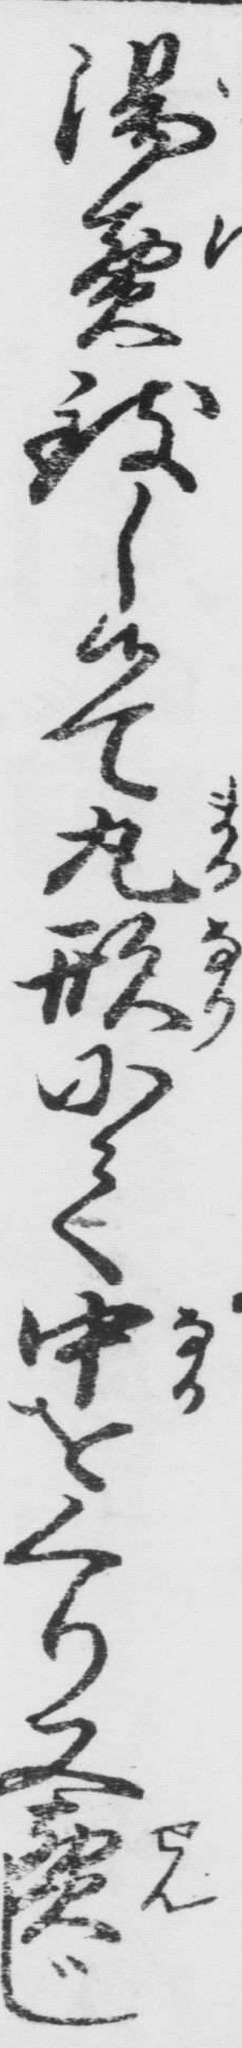湯煮致し候て丸形にて中をくり又煎じ
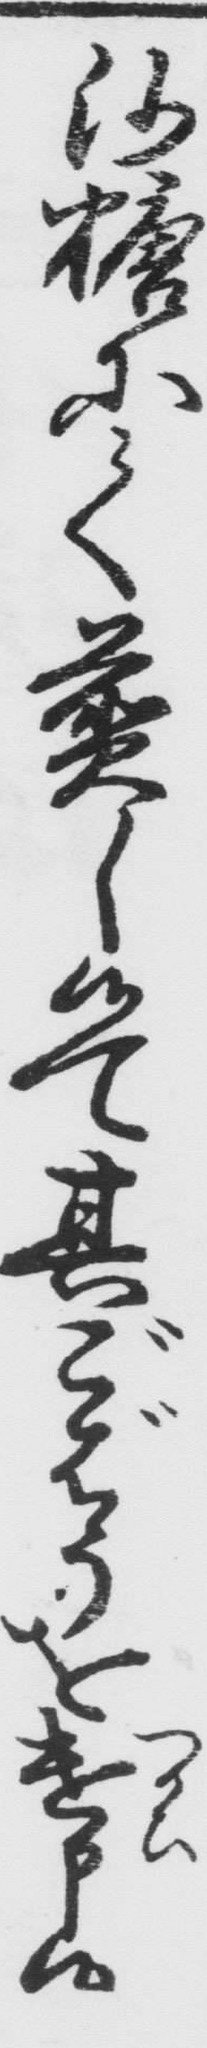沙糖にて煎し候て其ごばうを遣申候
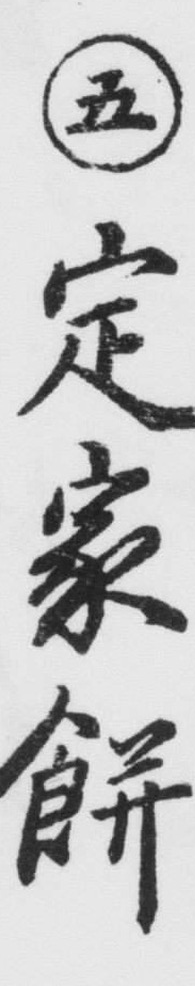(五)定家餅
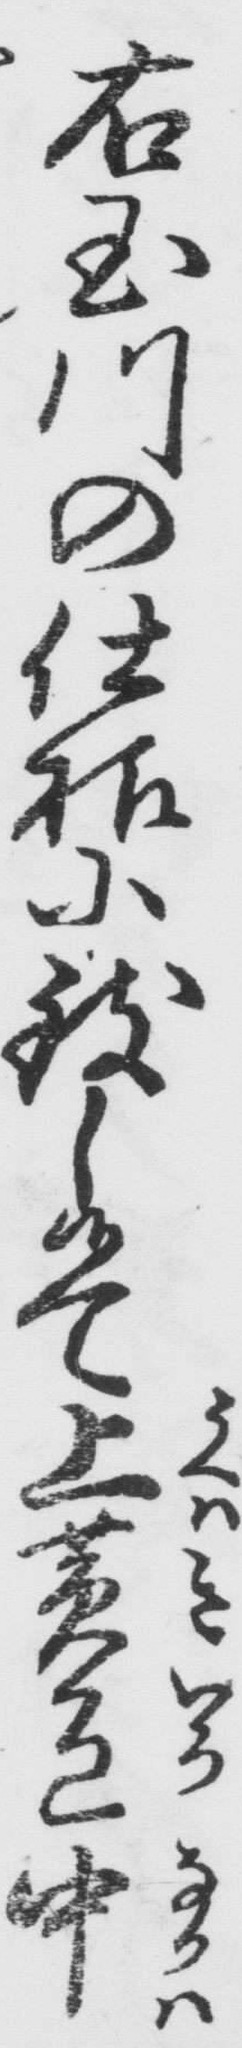右玉川の仕様に致し候て上黄色中
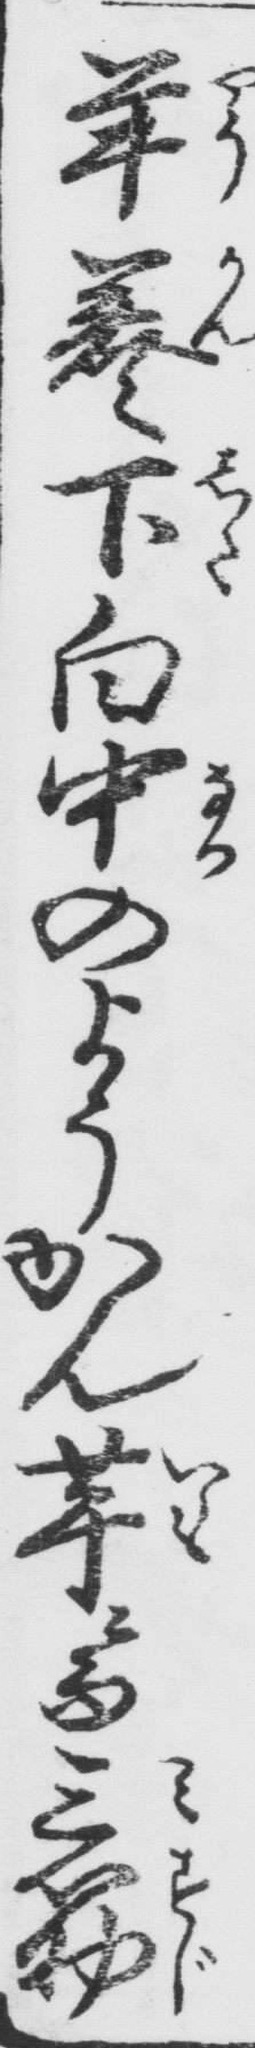羊羹下白中のようかん芋にて三筋
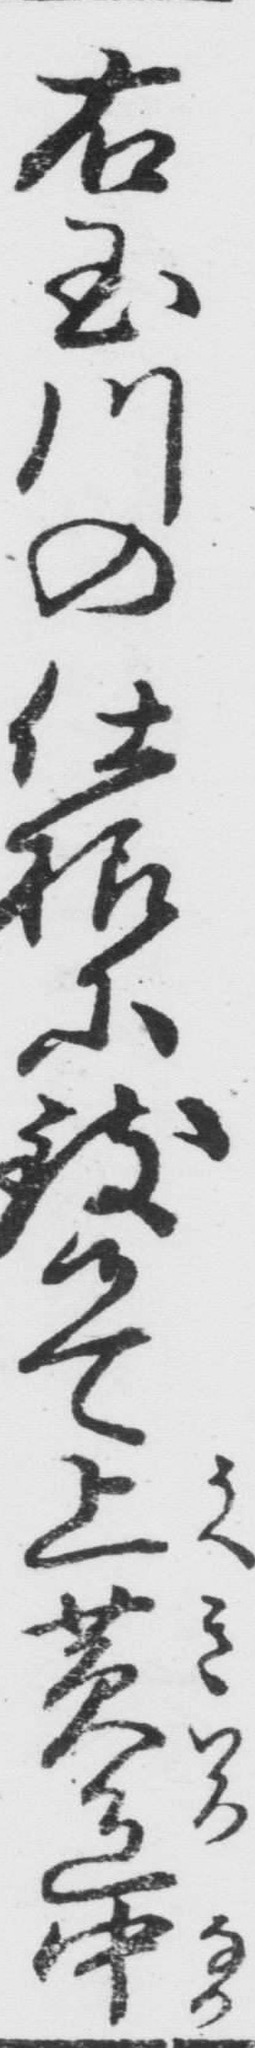右玉川の仕様に致候て上黄色中
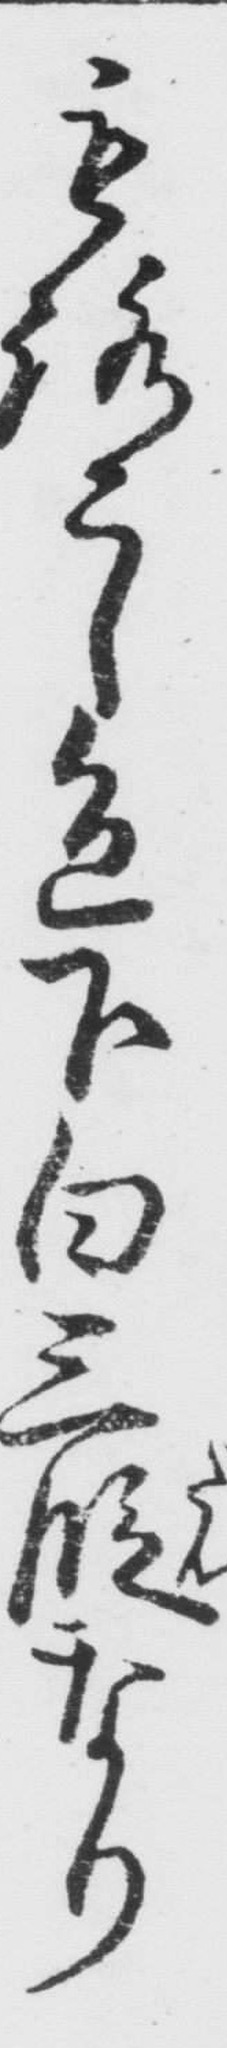もろこし色下白三段なり
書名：御前菓子図式
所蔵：大阪府立大学学術情報センター 国文学研究資料館
